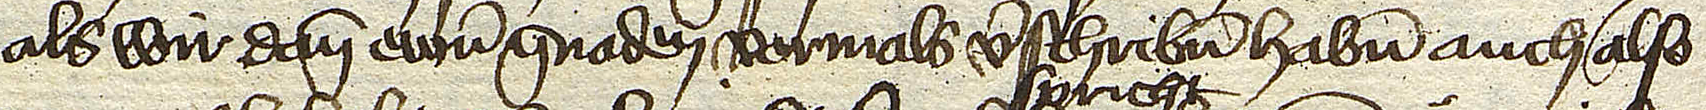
als wir dan* ew*n gnaden vormals v*ſchrib*n hab*n auch alſo
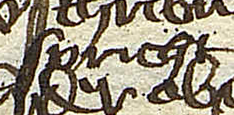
ſpricht
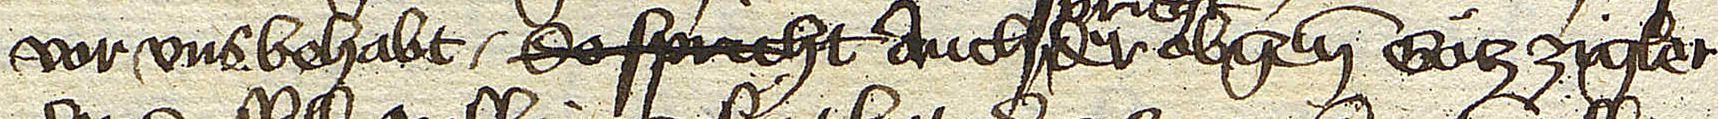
vor vns behabt / So ſpricht Auch der obgen* Göcʒ cʒigler
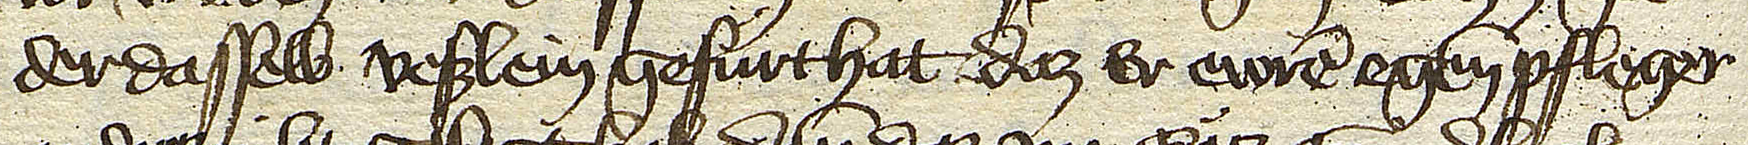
der daſſelb . veſʒlein gefürt hat . daʒ Er ewre* egen* pfleger
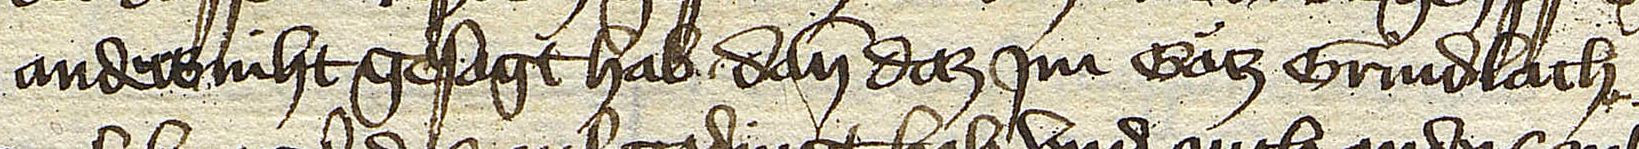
anders niht geſagt hab / dan* daʒ Im Göcʒ Grindlach
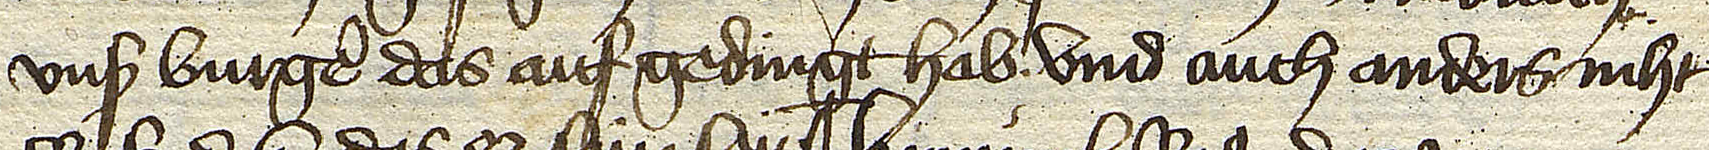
vnſ* burge* das auf gedingt hab . vnd auch anders niht
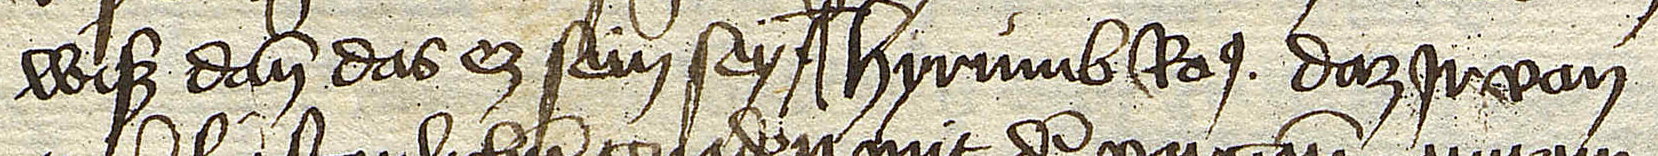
wiſʒ dan* das eʒ ſein ſey Hyrümb Ro* . daʒ Ir von
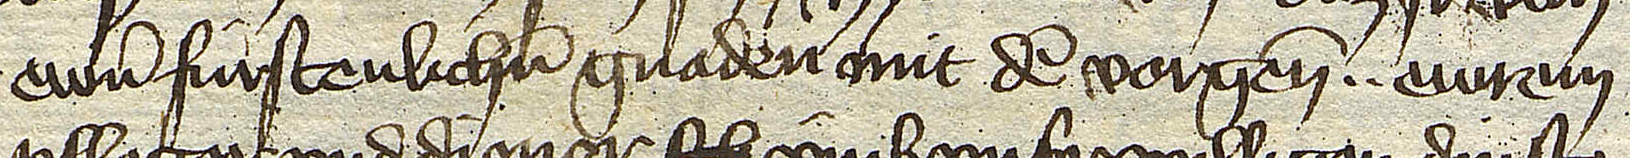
ew*n fürſtenlich*n gnaden mit de* vorgen* ~ ewrem
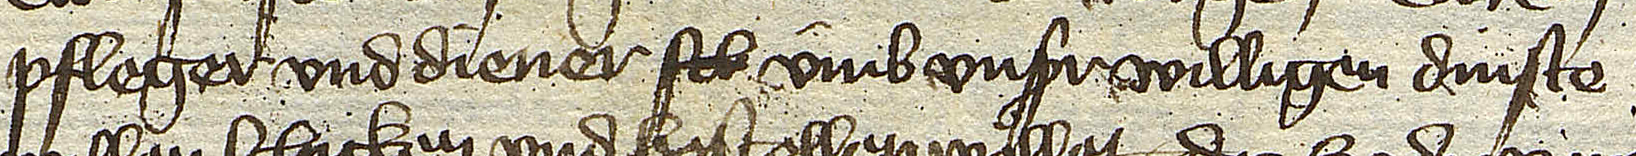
pfleger vnd diener ſch v̈mb vnſ*r willigen dinſte
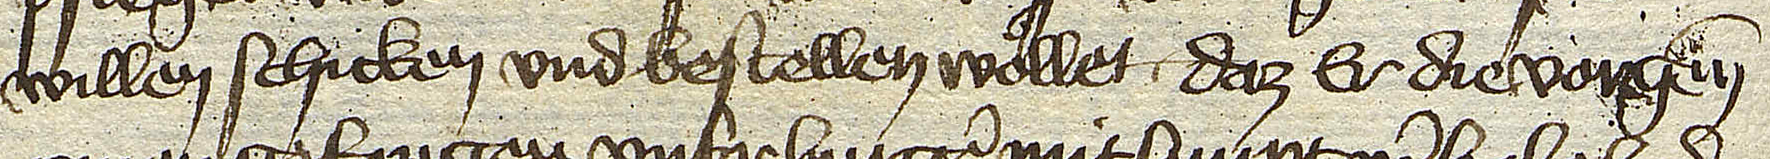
willen ſchicken vnd beſtellen wöllet / daʒ Er die vorgen*
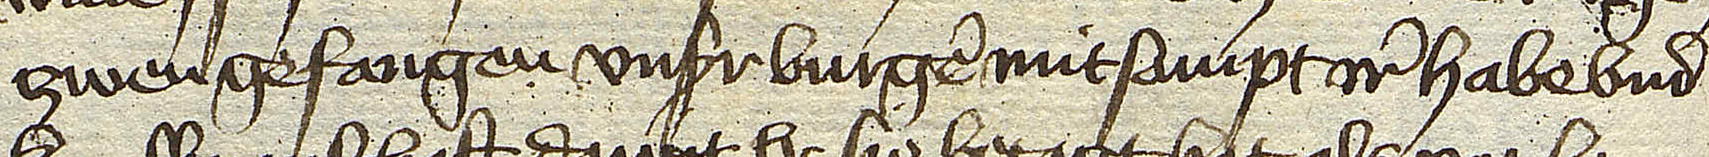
cʒwen gefangen vnſ*r burge* mitſampt ir* habe vnd
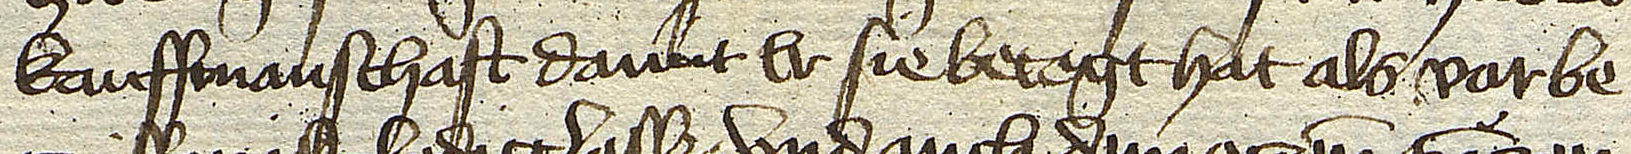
kauffmanſchaft damit Er ſie betegt hat als vor be
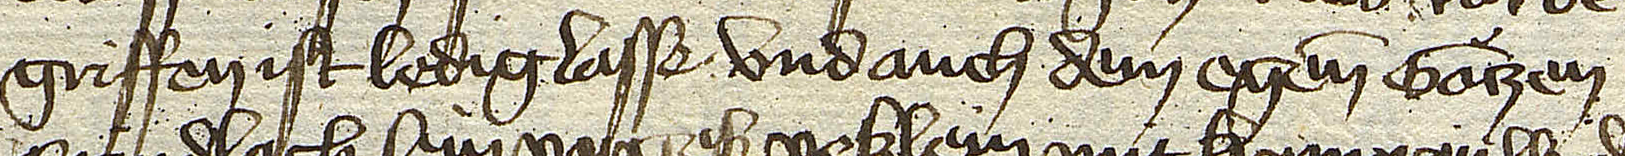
griffen iſt ledig laſſe . Vnd auch dem egen* Göcʒen
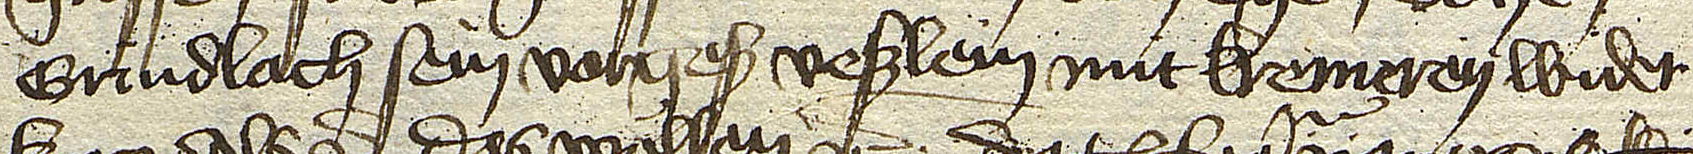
Grindlach ſein vorgeſ* veſʒlein mit kremerey wider
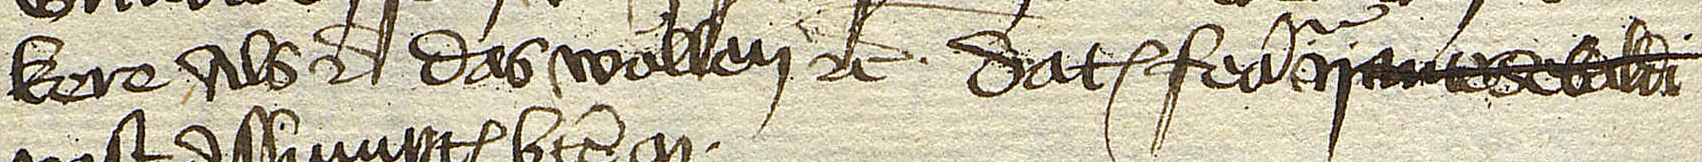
kere Als ec* das wöllen ec* . Dat* fea* ii* ante Sebaldi
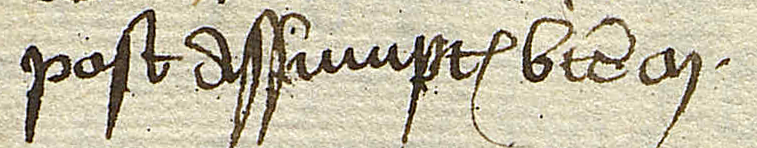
poſt Aſſumpt* b*te M*
